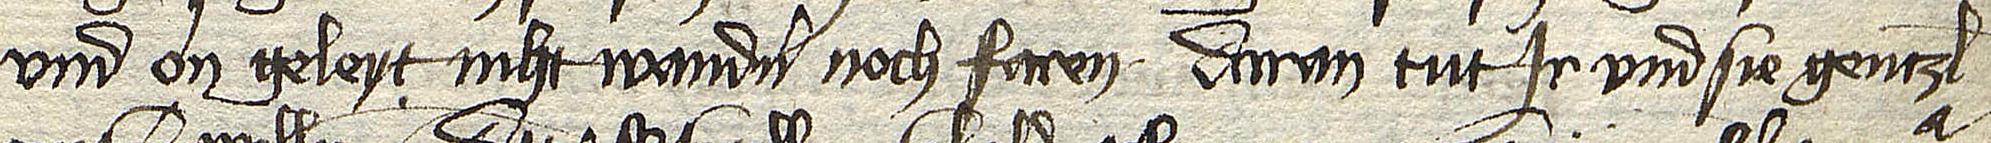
vnd on geleyt niht wandn* noch faren / Daran tut Ir vnd ſie gencʒl*
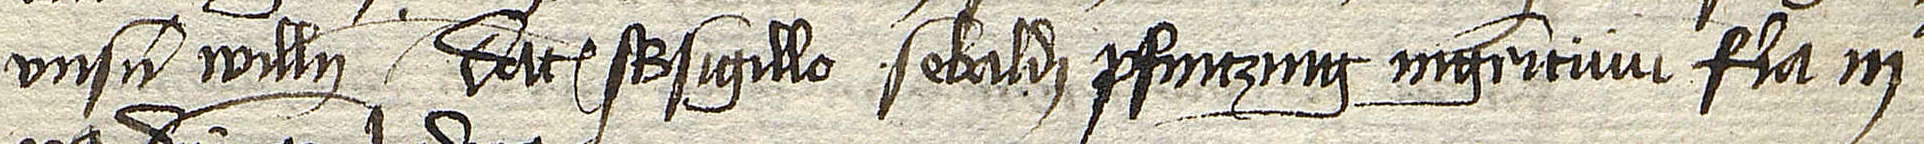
vnſn* willn* / Dat* ſ* ſigillo . ſebaldi pfincʒing m*griciuiu* fi*a iii*
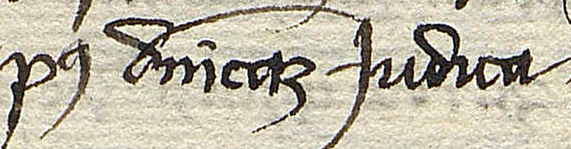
p* dni*ca* Iudica
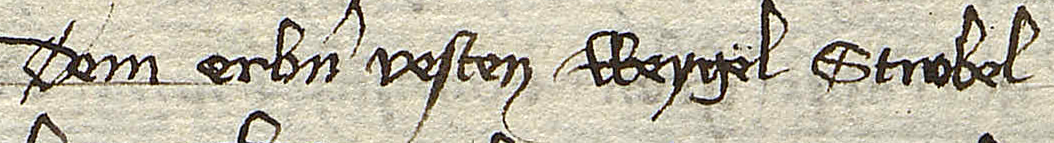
Dem erbn* veſten / Weygel Strobel
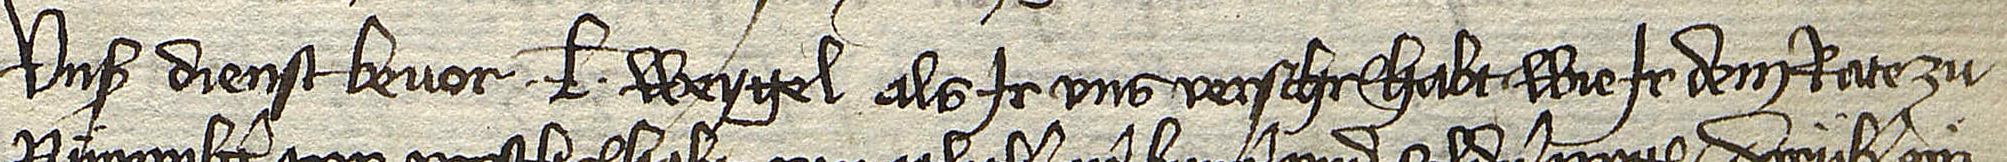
Vnſ* dienſt beuor L* Weygel als Ir vns verſchr* habt / wie Ir dem Rate ʒu
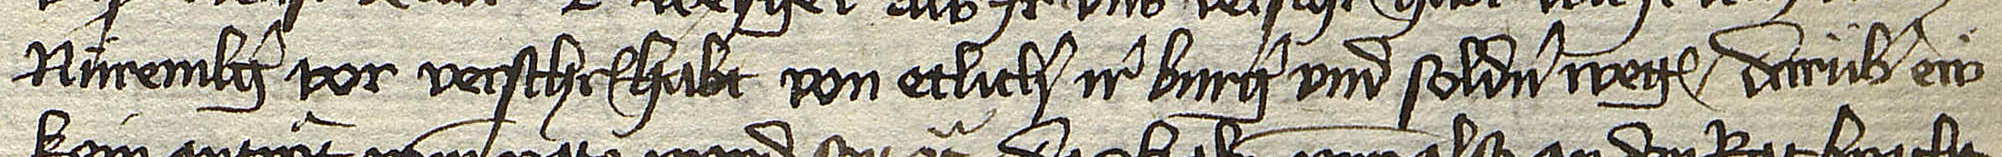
Nüremb*g vor verſchr* habt von etlich* ir* burg* vnd ſoldn* weg* / Darüb* eẅ
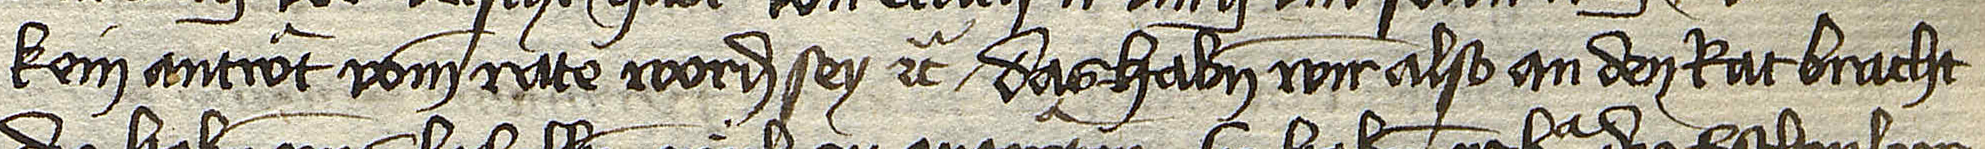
kein antw*t vom* rate word* ſey ec* / Das habn* wir alſo an den Rat bracht
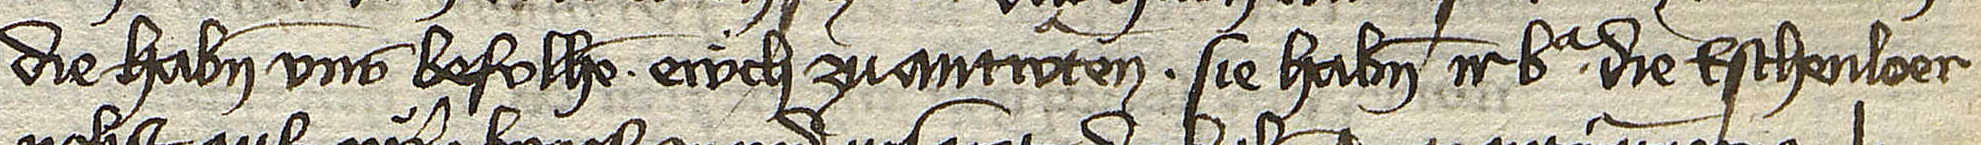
die habn* vns befolhe* . eẅch ʒu antw*ten . ſie habn* ir b* . die Eſchenloer
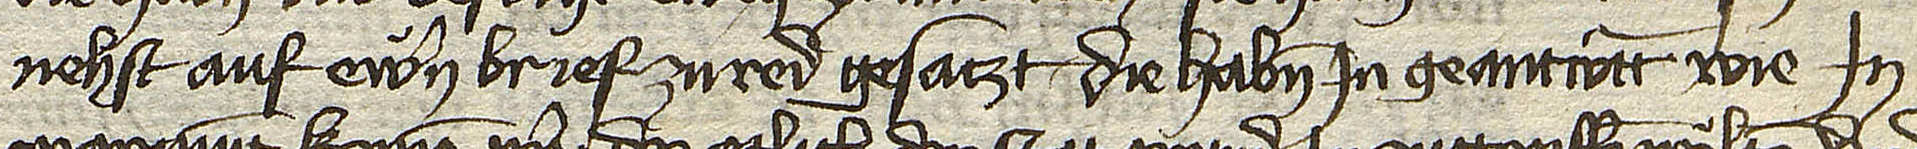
nehſt auf eẅ*n brief ʒu red geſacʒt / die habn* In geantw*tt . wie In
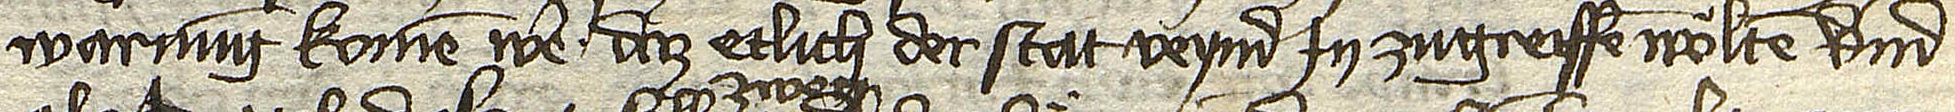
warnu*g kome* w*e . daʒ etlich der ſtat veynd In ʒugreiffe* wölte* Vnd
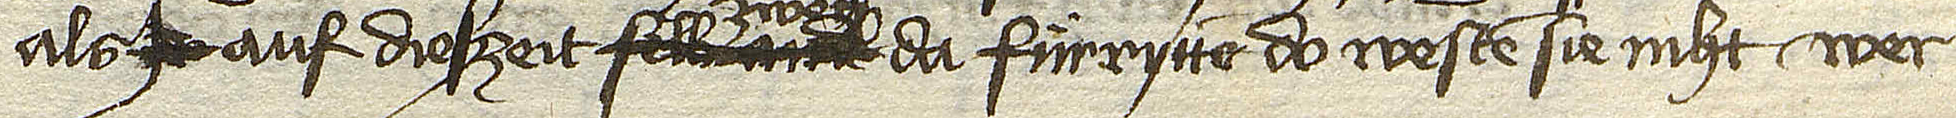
als Ir auf dieſ*ʒeit ſelb and* da fürrytte* do weſte* ſie niht / wer
